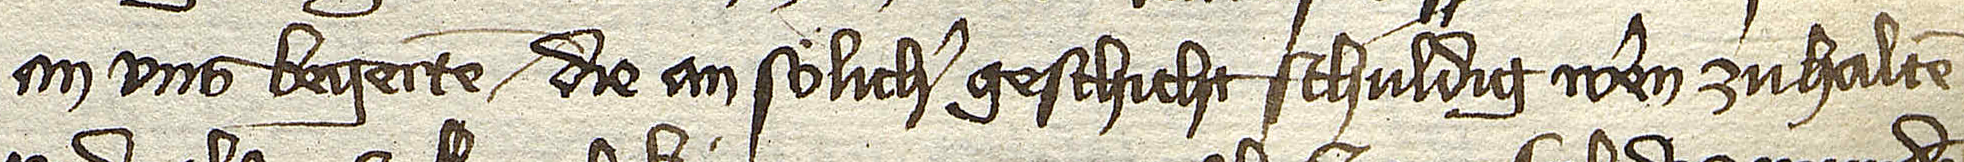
an vns begerte* / die an ſölich* geſchicht ſchuldig w*en ʒu halte*
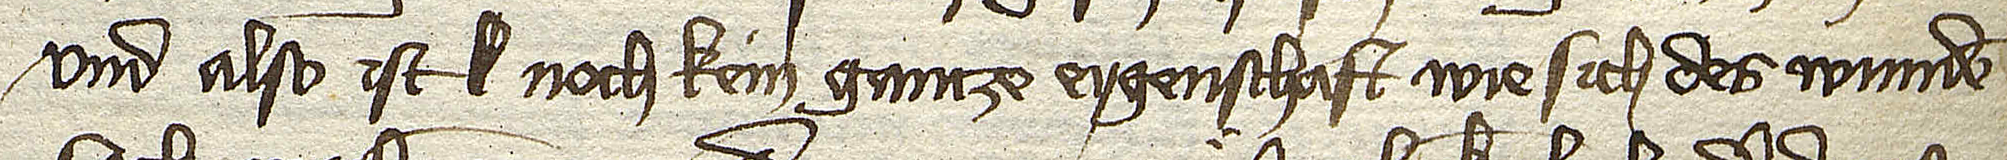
vnd alſo iſt k noch kein gancʒe eygenſchaft wie ſich des wunde*
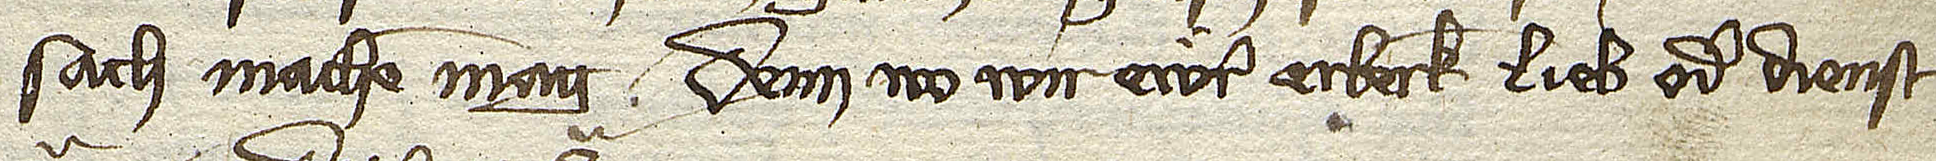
ſach mache* mag / Denn wo wir eẅr* erberk* lieb od* dienſt
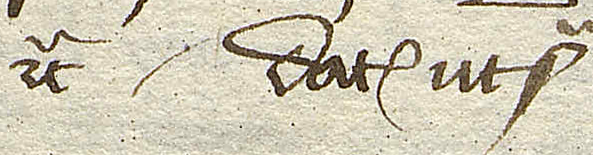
ec* / Dat* ut ſ*
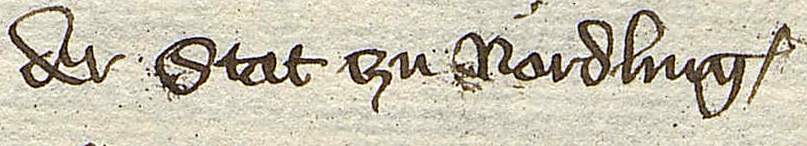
der Stat cʒu Nördling*
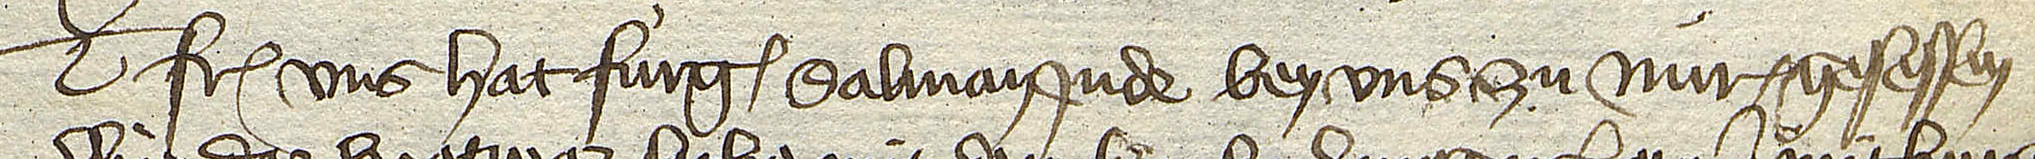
L* fr* vns hat fürg* Salman Iude bey vns cʒu Nür* geſeſſen
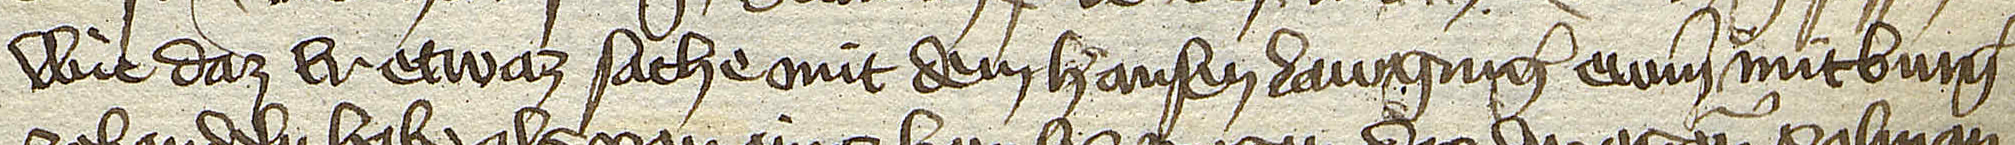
wie daʒ Er etwaʒ ſache mit dem hanſen lawging* ewm* mitburg*
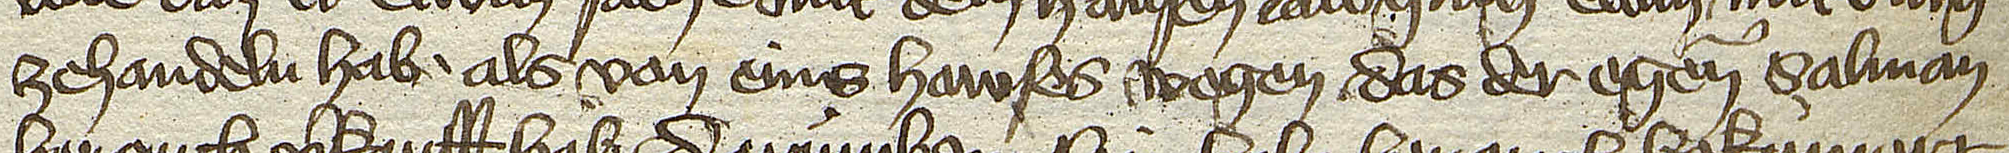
cʒehandeln hab . als von eins hawſes wegen / das der egen* Salman
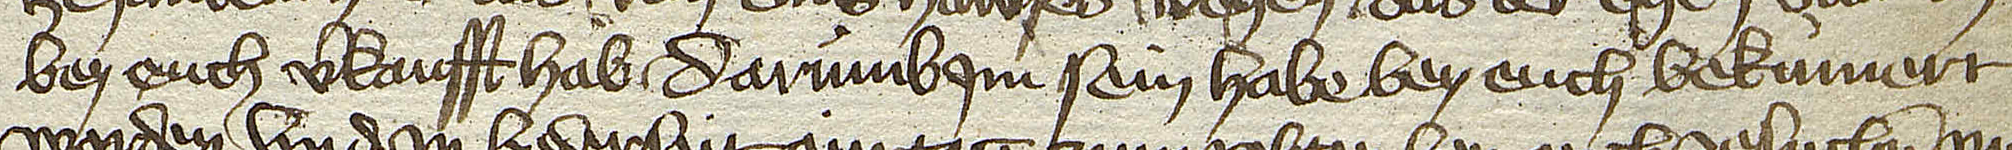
bey euch v*kaufft hab / Darümb Im ſein habe bey euch bekümert
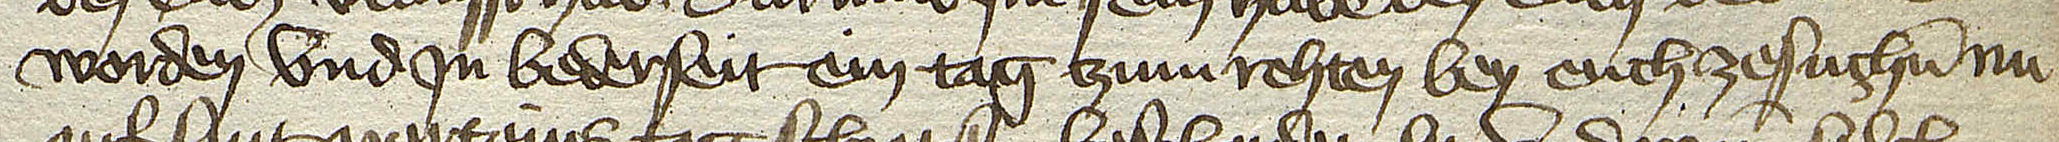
worden vnd In bederſeit ein tag cʒum rehten bey euch cʒeſuchn* nu
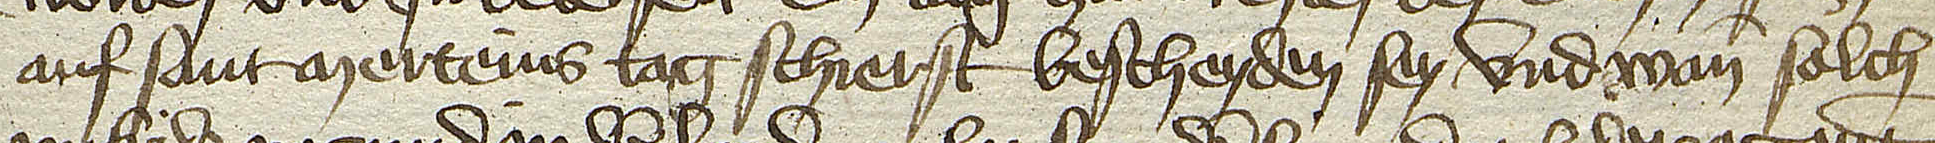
auf ſant Merteins tag ſchieriſt beſcheyden ſey / Vnd wan* ſolch
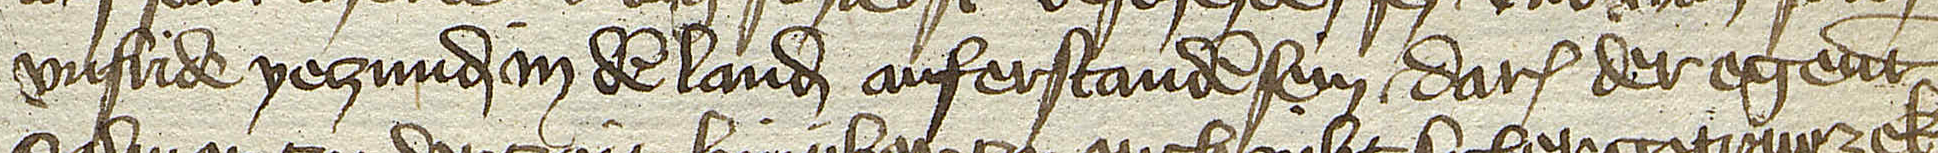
vnfride yecʒund* in de* land* auferſtande* ſein / Dar* der egent*
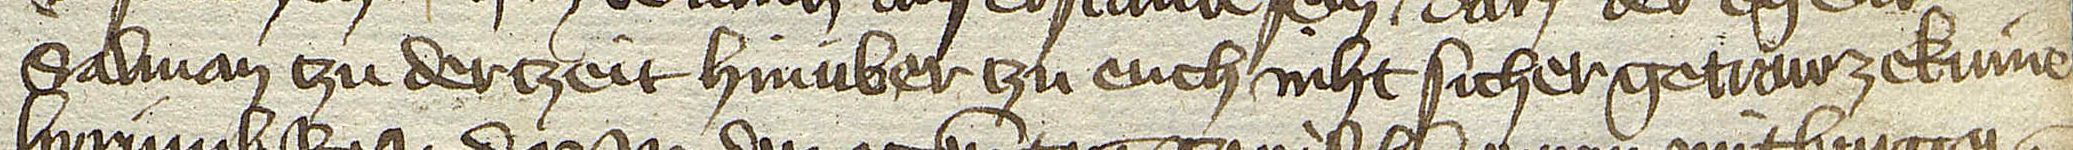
Salman cʒu dercʒeit hinüber cʒu euch niht ſicher getraw ʒekume*
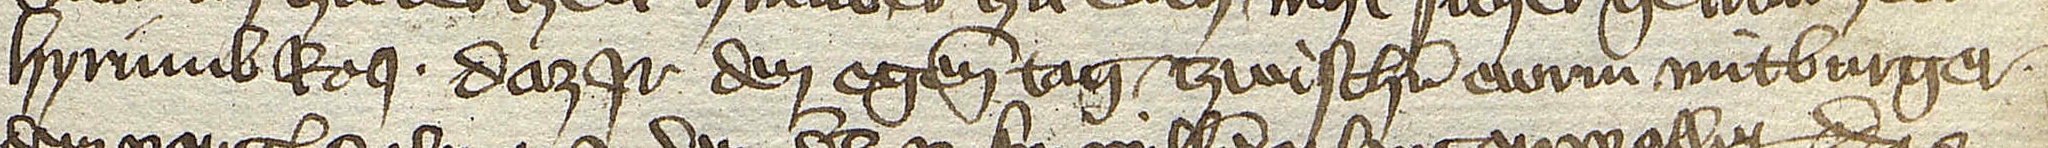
hyrümb Ro* . daʒ Ir den egen* tag / cʒwiſchn* ewrm mitburger
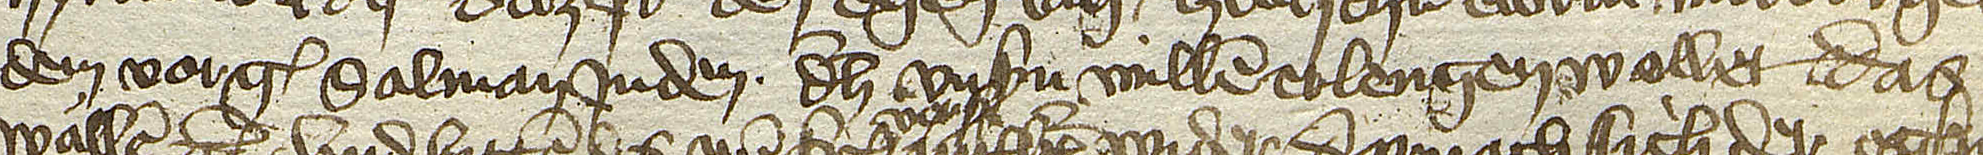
dem vorg* Salman Iuden . dh* vnſ*n wille* erlengen wollet / Das
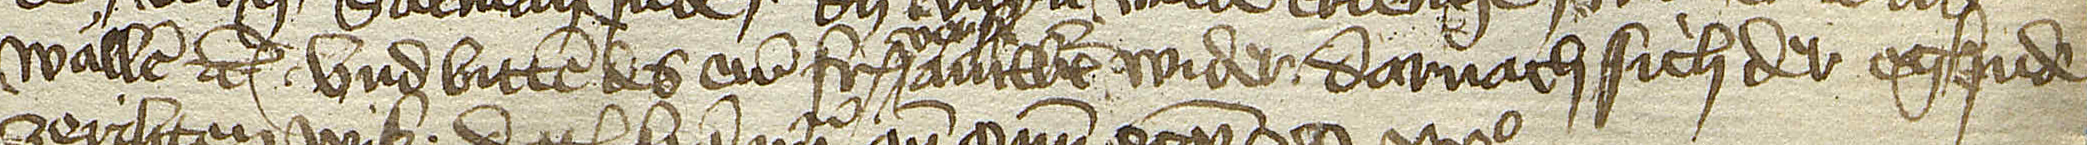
wölle* ec* / vnd bitte* des ew* fr* antw*t wider / darnach ſich der eg* Iude
